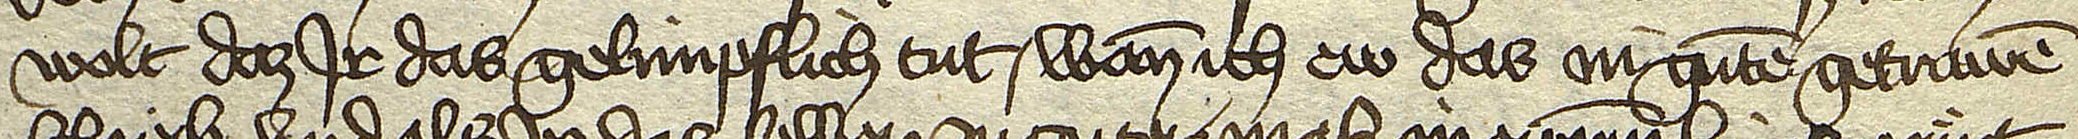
wolt daʒ Ir das gelimpflich tut / wan* ich ew das gute* getrawe*
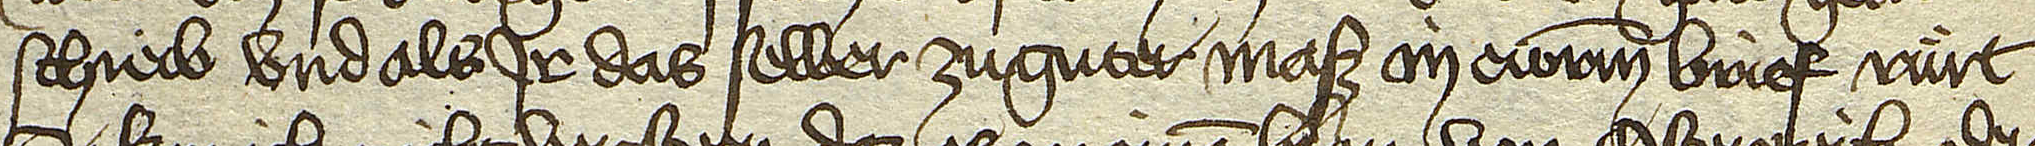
ſchreib vnd als Ir das ſelber cʒuguter maſʒin ewrm* brief rürt
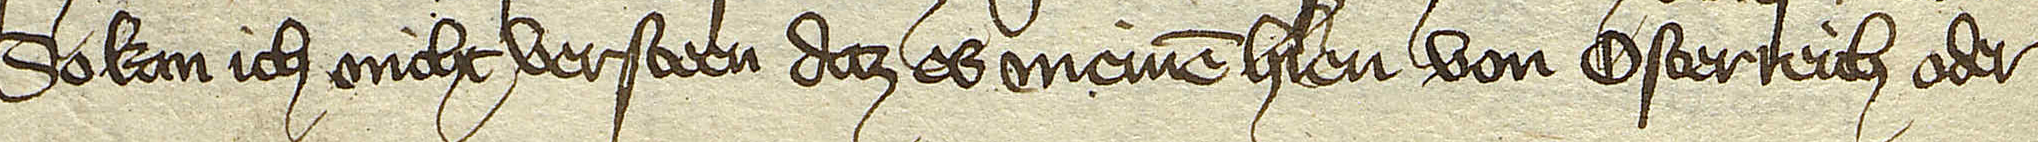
So kan ich nicht verſteen daʒ es meine* hr*en von Oſterreich oder
